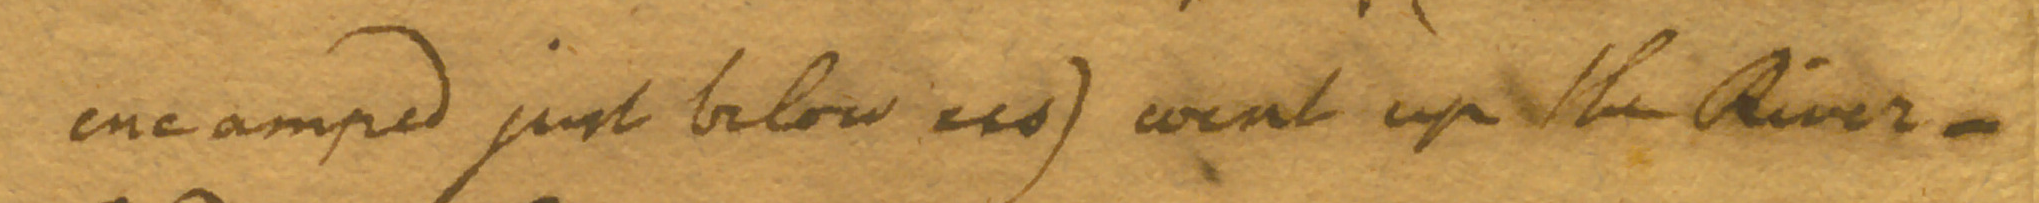encamped just below us) went up the River-
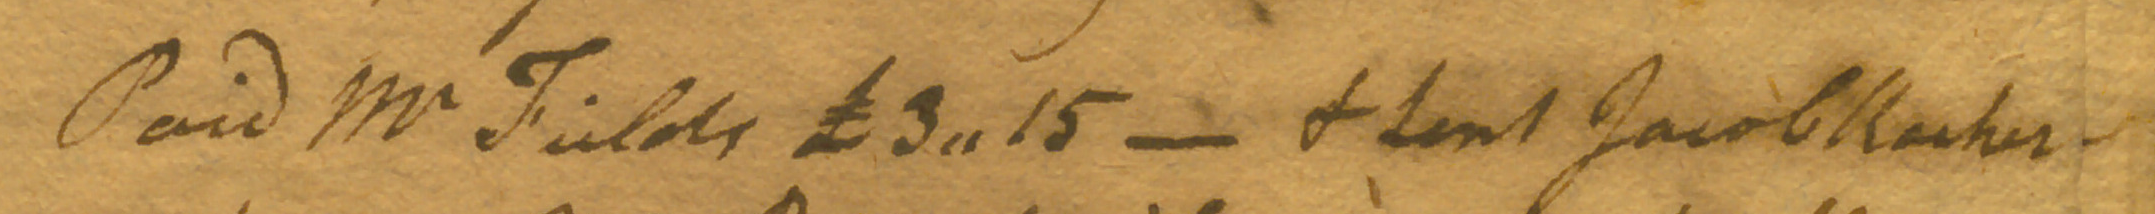Paid M^r. Fields £3..15- & Lent Jacob Rasher
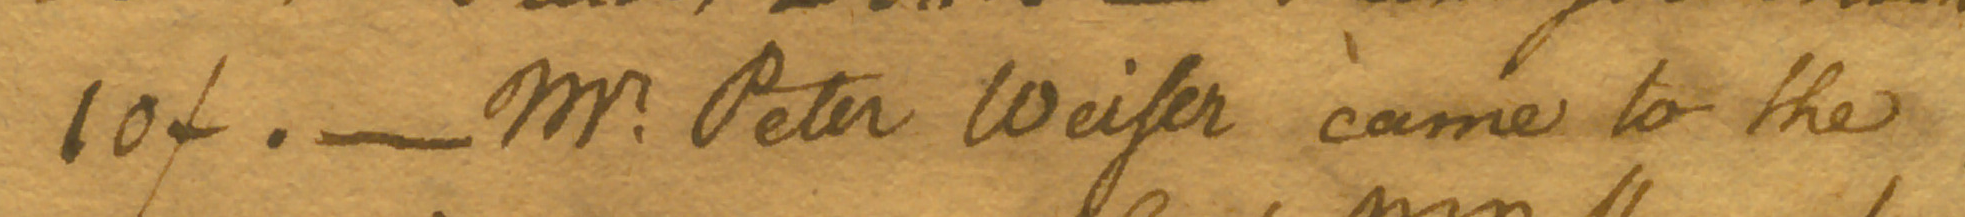10s.- M^r. Peter Weiser came to the
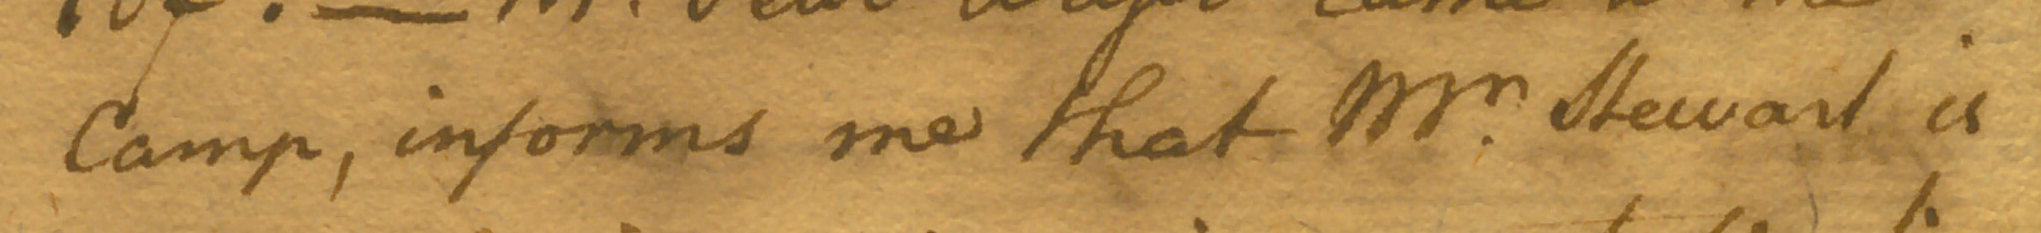camp, informs me that Mr. Stewart is
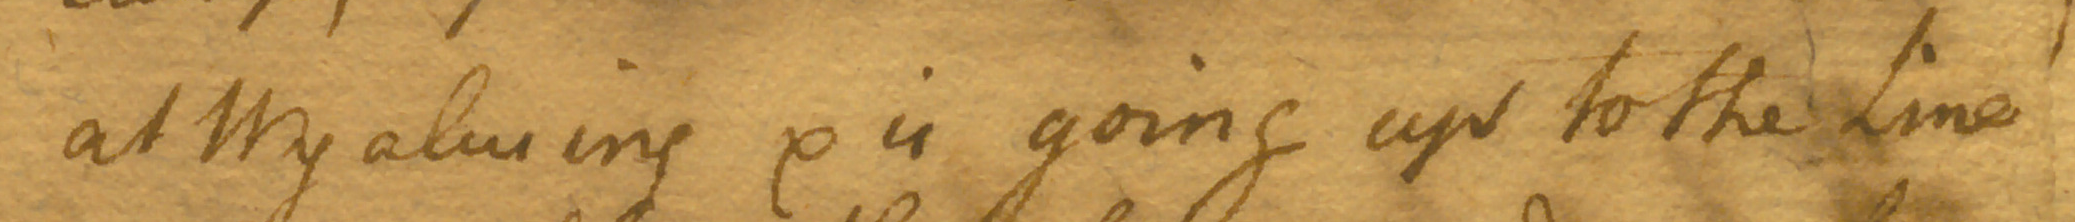at Wyalusing & is going up to the Line
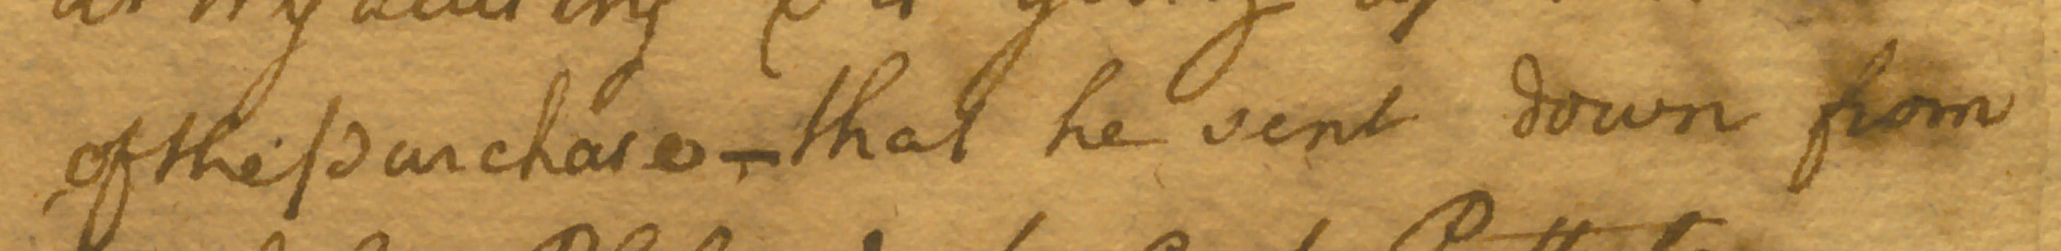of the purchase- that he sent down from
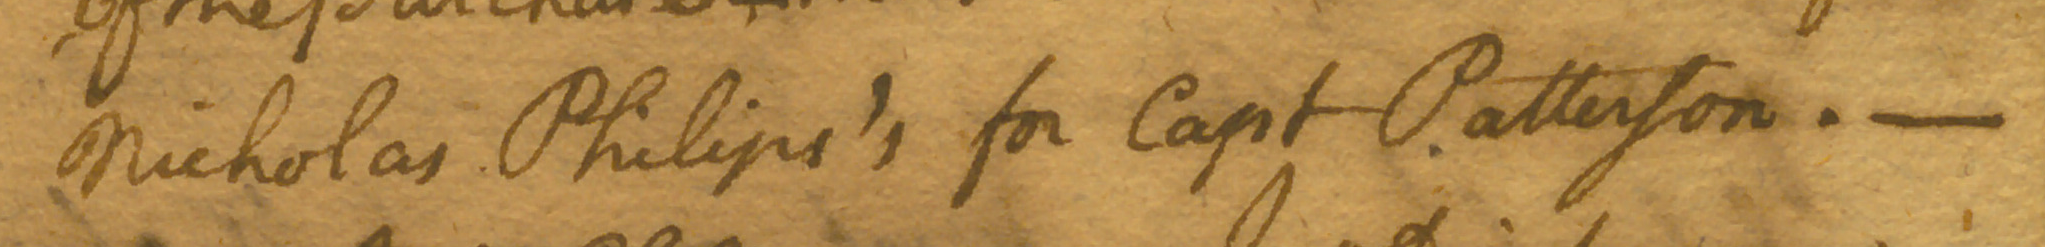Nicholas Philips's for Capt Patterson.-
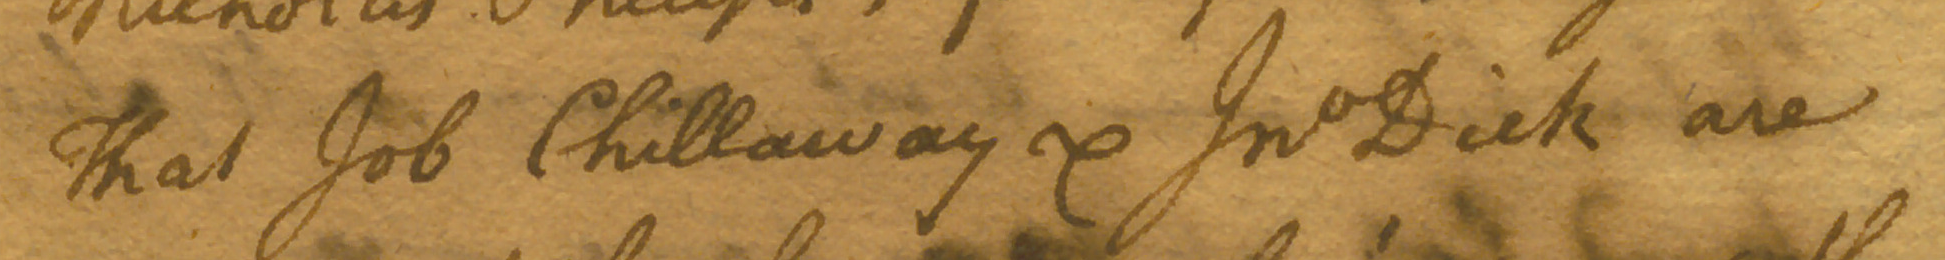That Job Chillaway & Jn^o Dick are
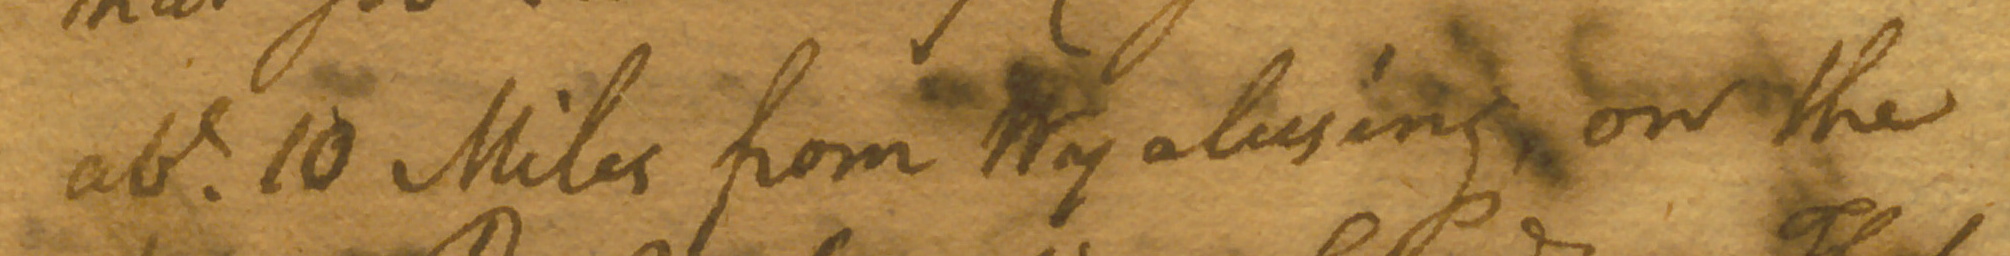ab^t. 10 Miles from Wyalusing on the
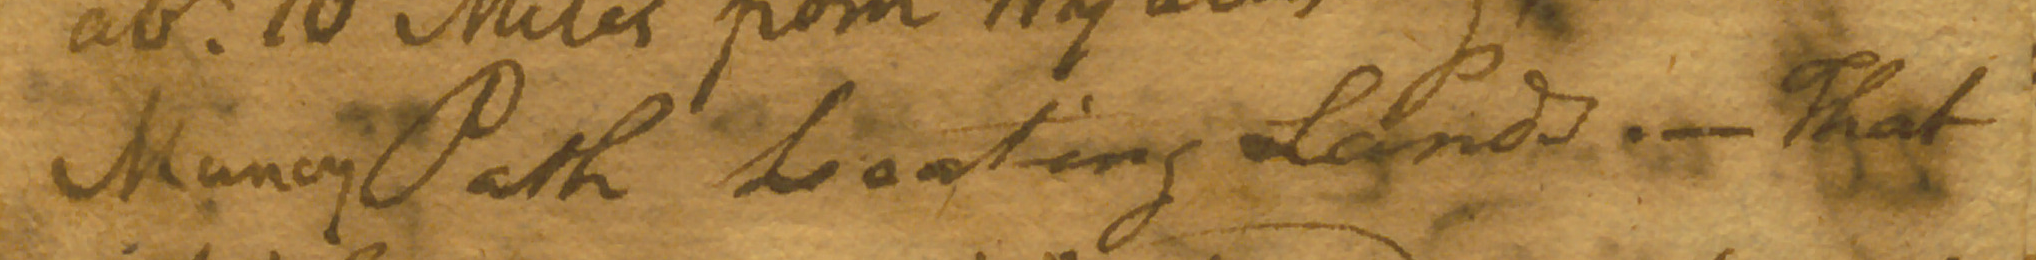Muncy Path Lasting Lands.- That
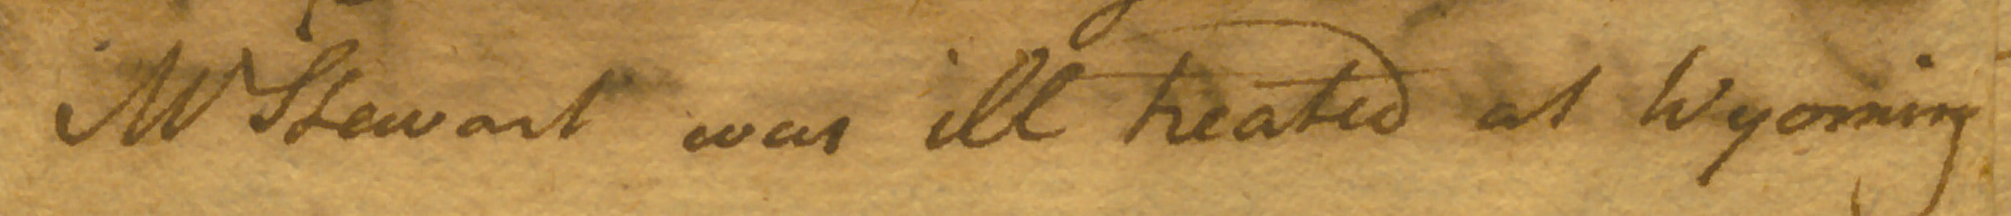M^r Stewart was ill heated at Wyoming
